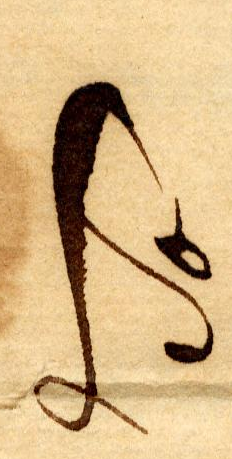To
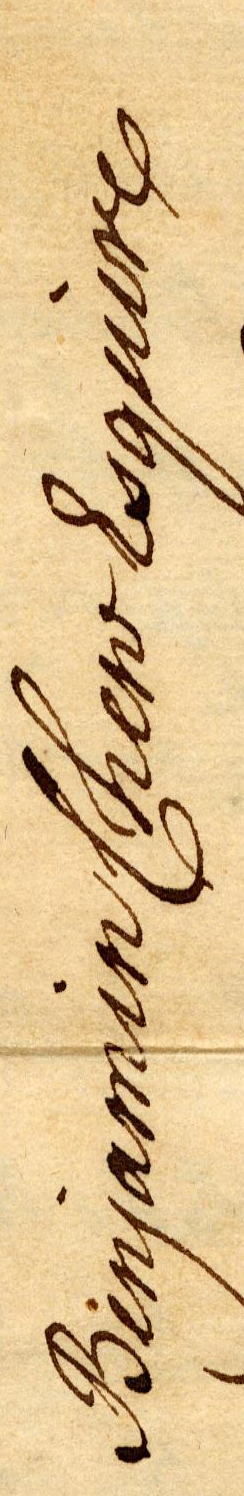Benjamin Chew Esquire
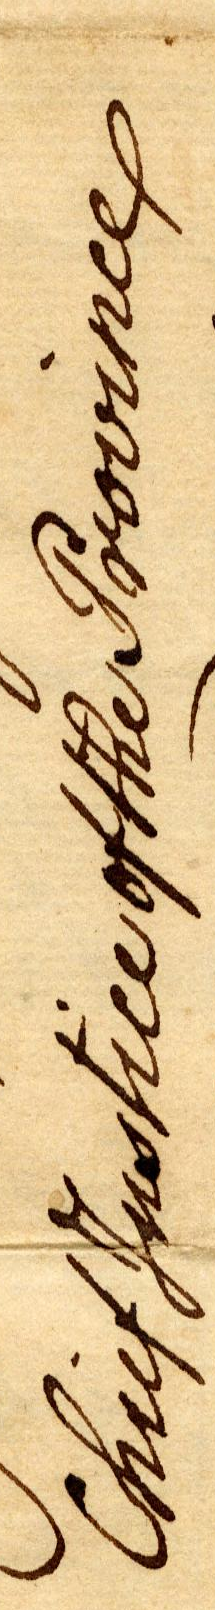Chief Justice of the Province
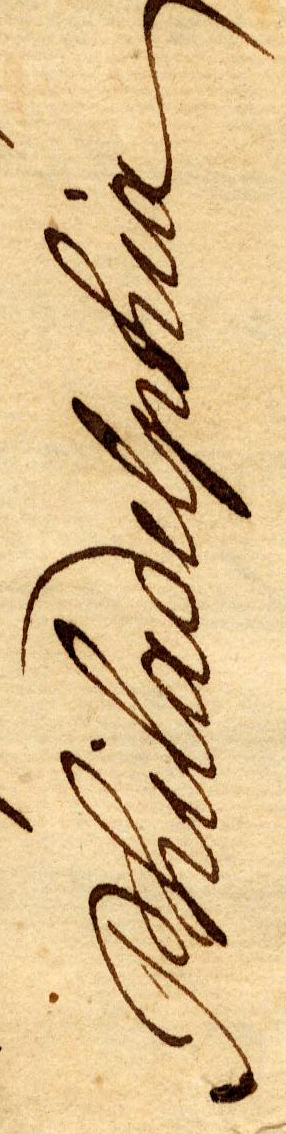Philadelphia
